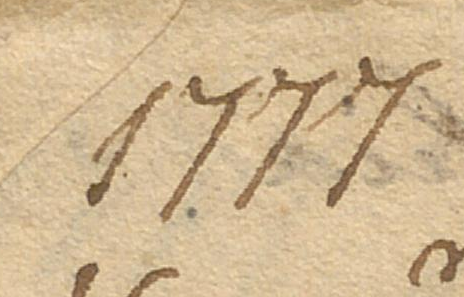1777
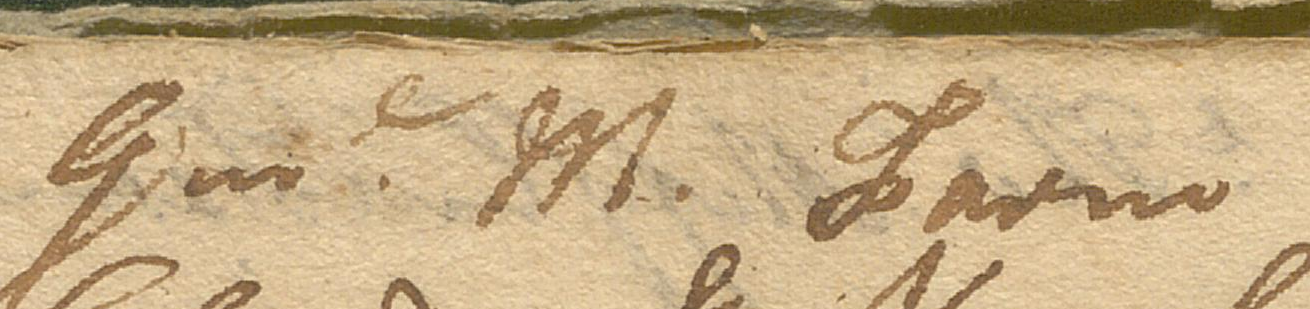Gen^l. M. Farm
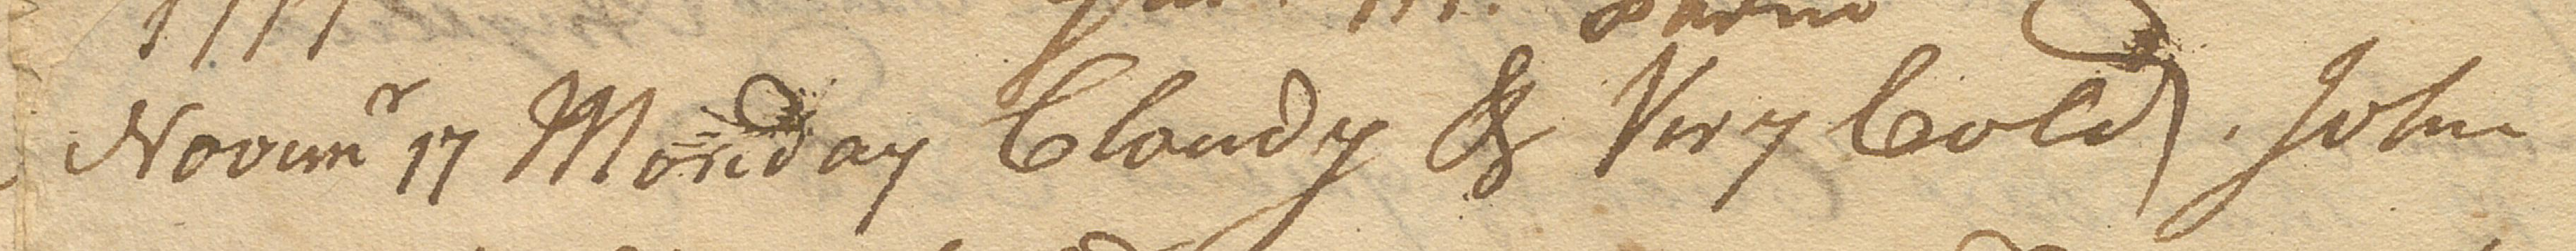Novem^r 17 Monday Cloudy & Very Cold John
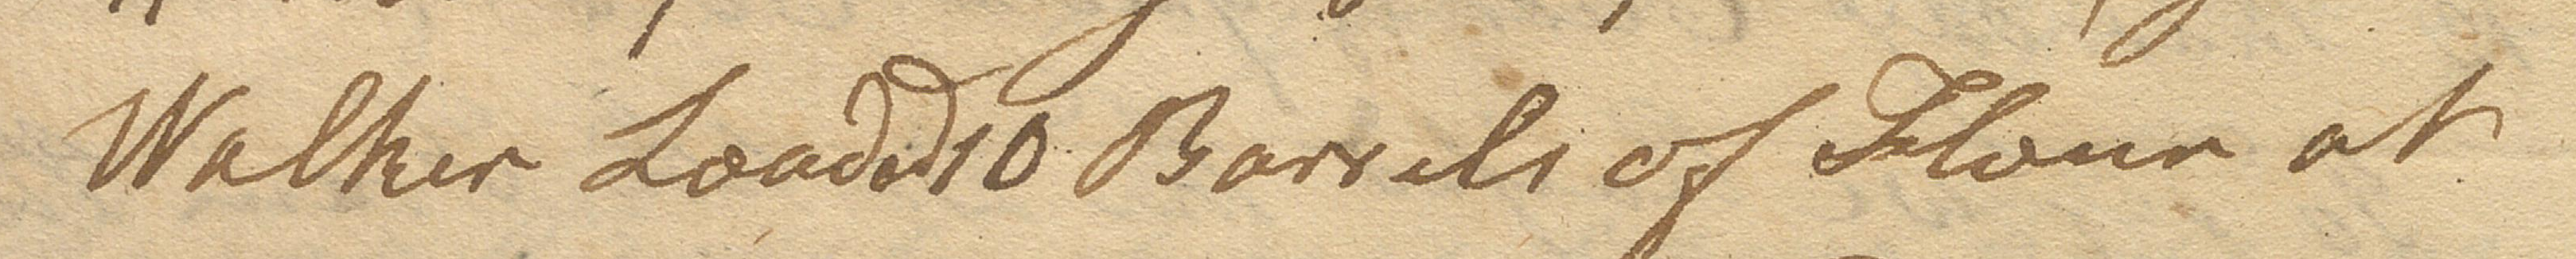Walker Loaded 10 Barrels of Flour at
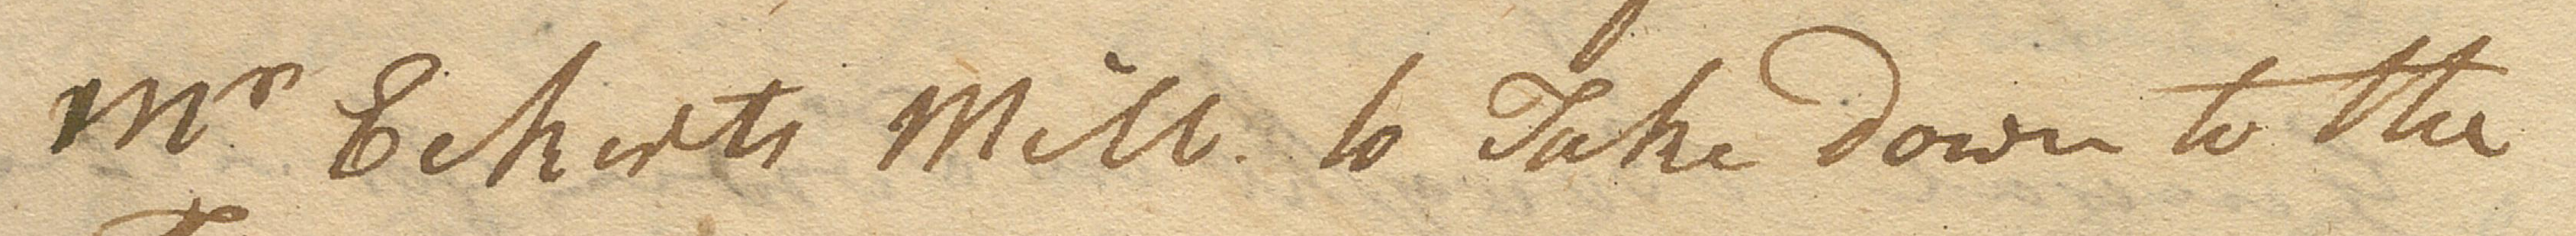M^r. Eckerts Mill to Take down to the
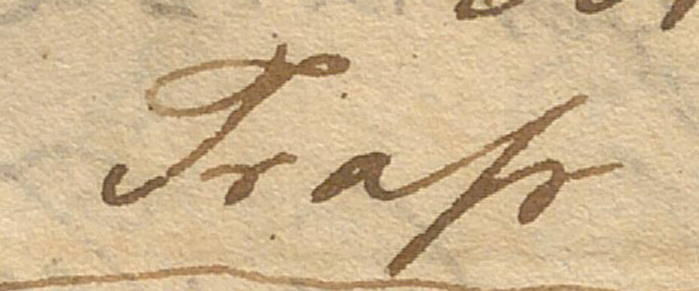Trap
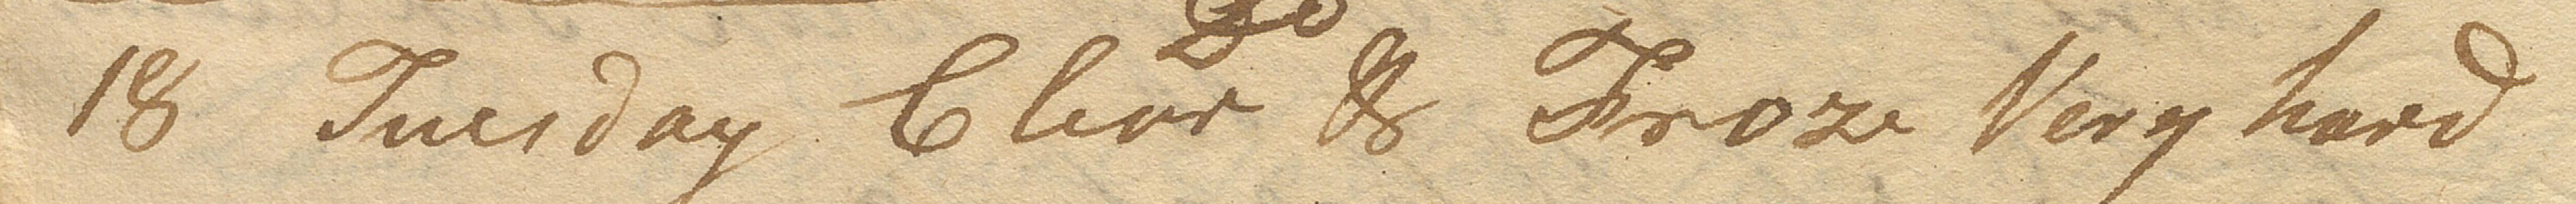18 Tuesday Clear & Froze Very hard
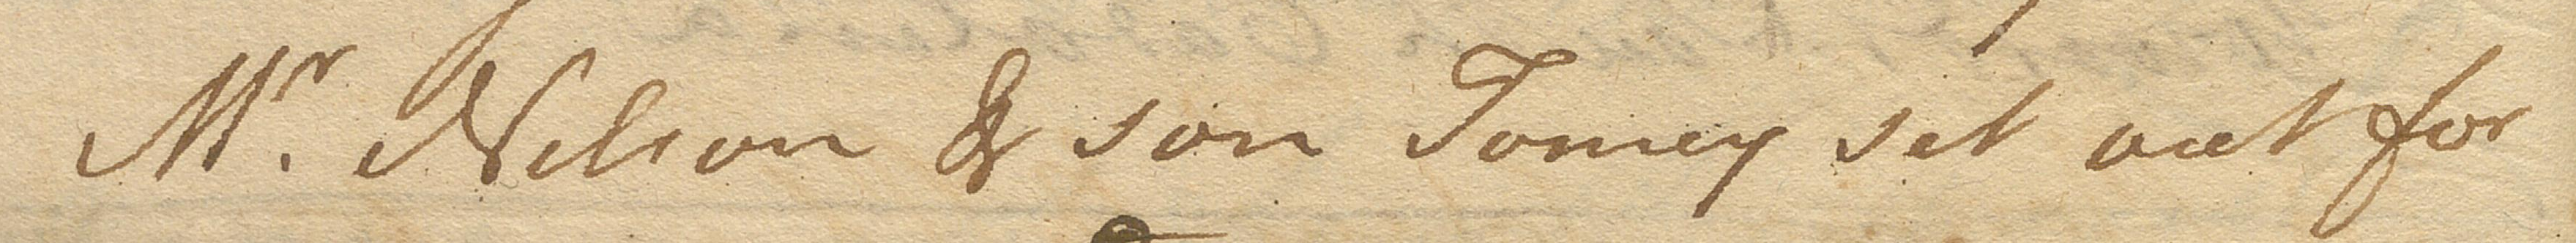M^r. Nelson & son Tomey set out for
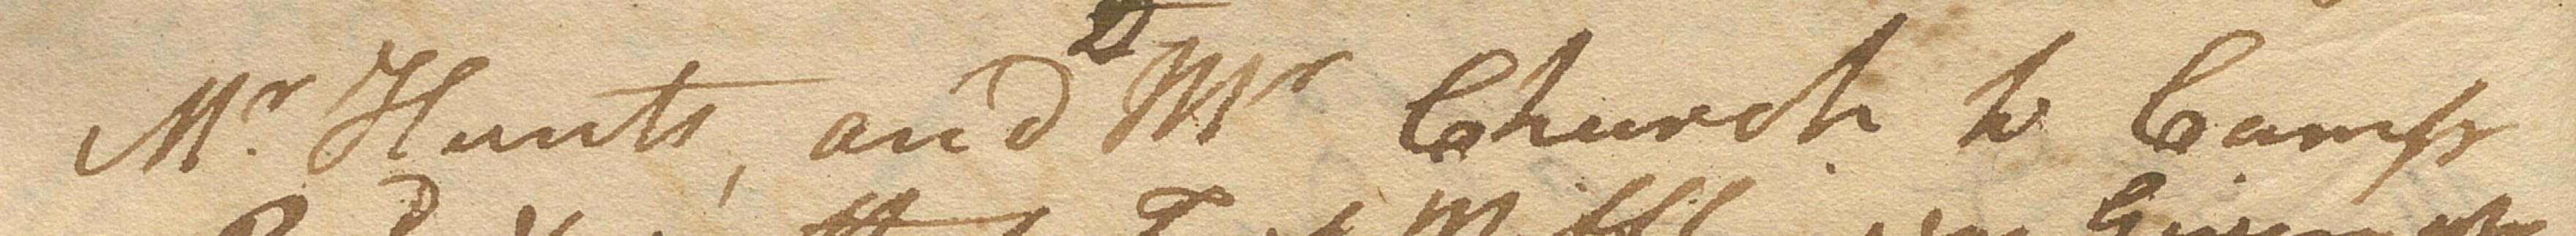M^r. Hunts, and M^r. Church to Camp
